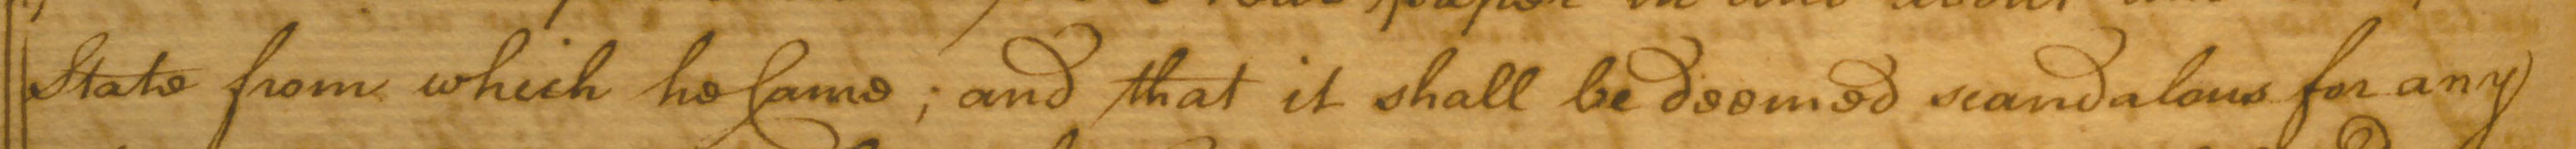State from which he Came; and that it shall be deemed scandalous for any
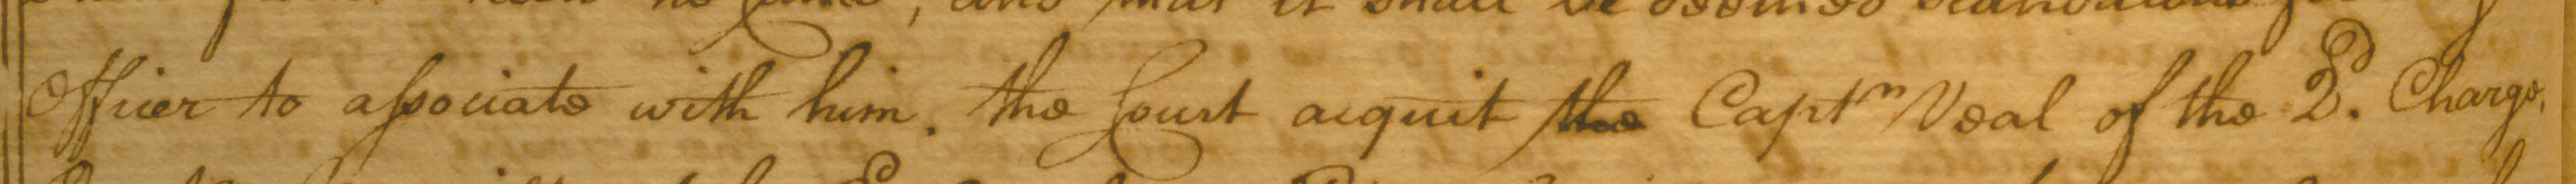Officer to associate with him. the Court acquit the Capt^n. Veal of the 2^d. Charge
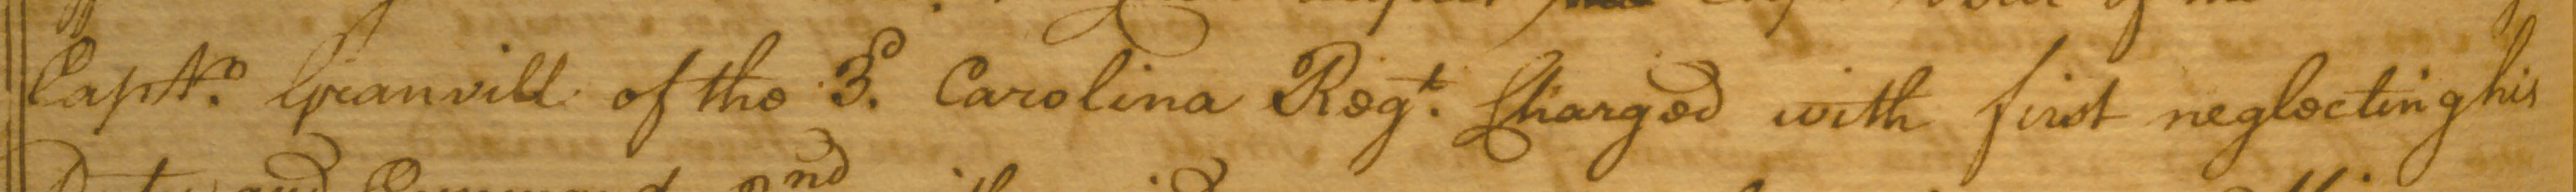Capt^n. Granvill of the 3^d. Carolina Reg^t. Charged with first neglecting his
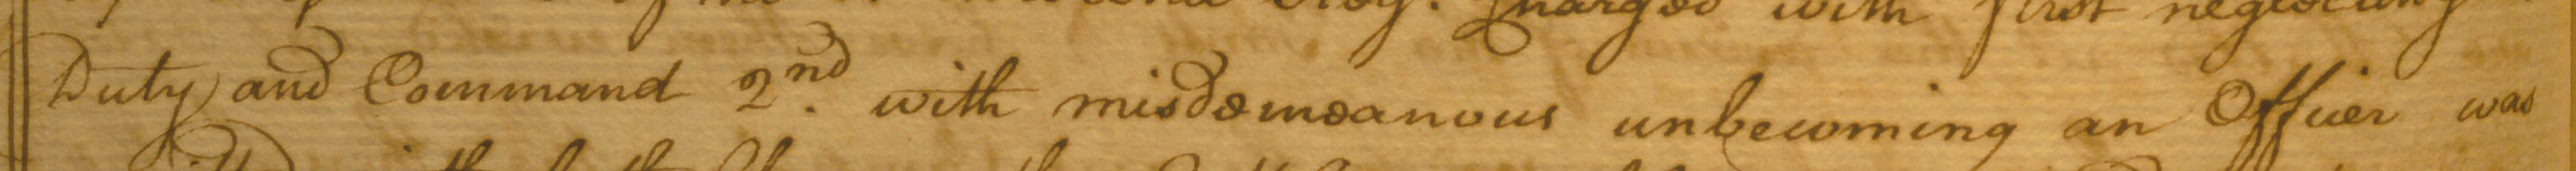Duty and Command 2^nd. with misdemeanors unbecoming an Officer was
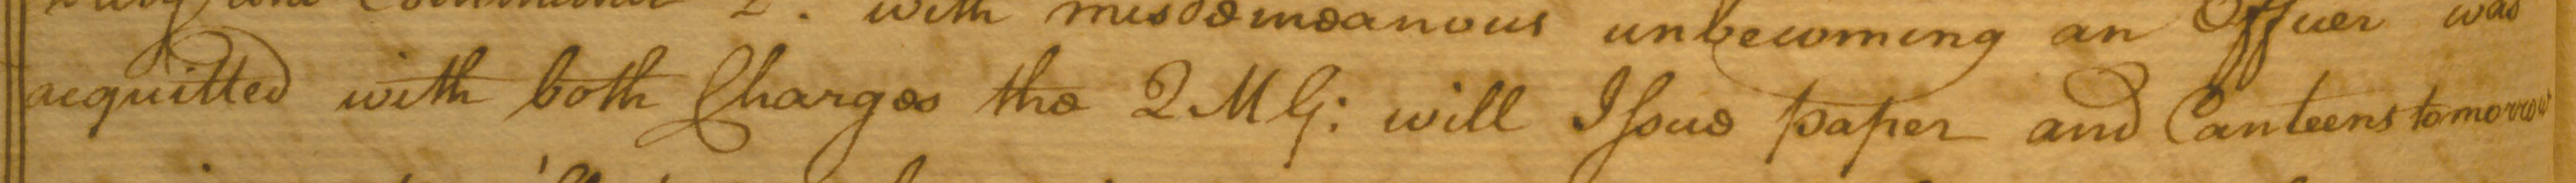acquitted with both Charges the QMG: will Issue paper and Canteens tomorrow
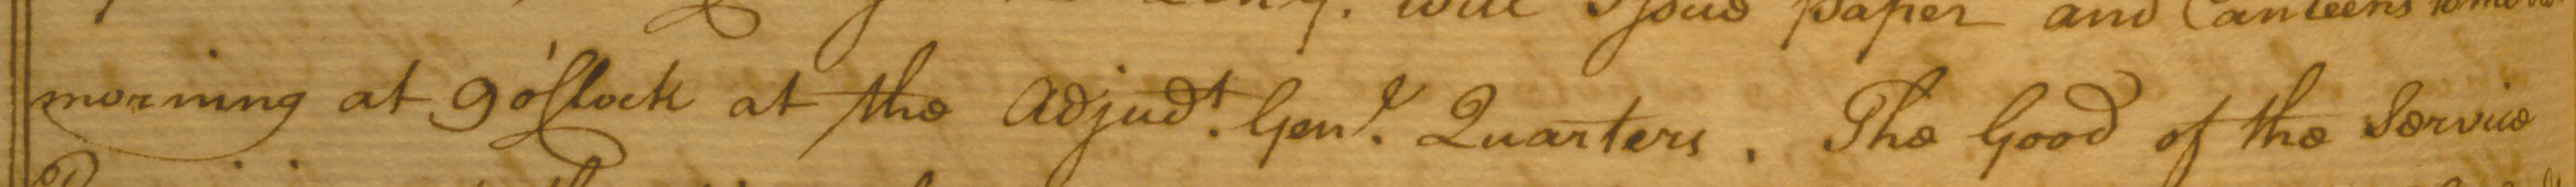morning at 9 o'Clock at the adjud^t. Gen^l. Quarters. The Good of the Service
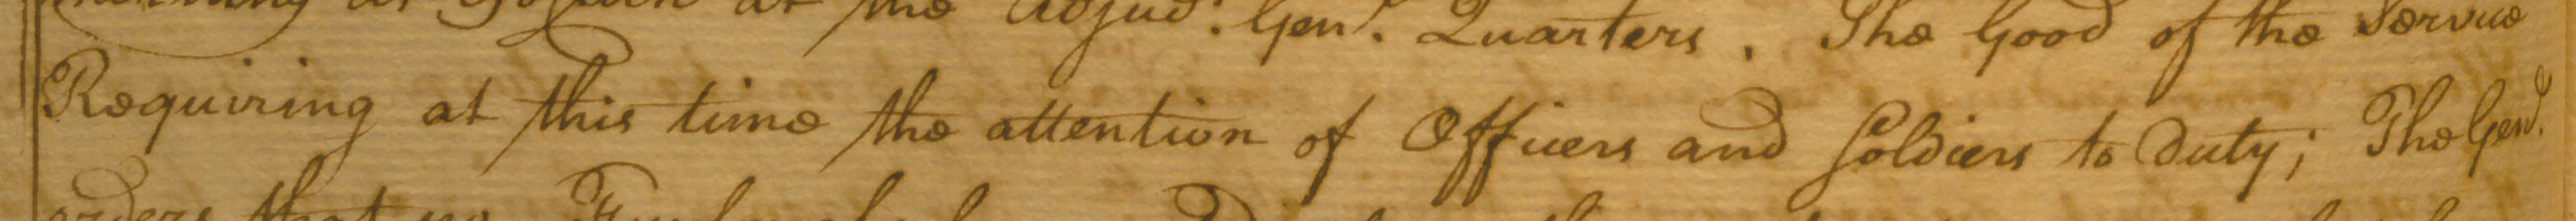Requiring at this time the attention of Officers and Soldiers to duty; The Gen^l.
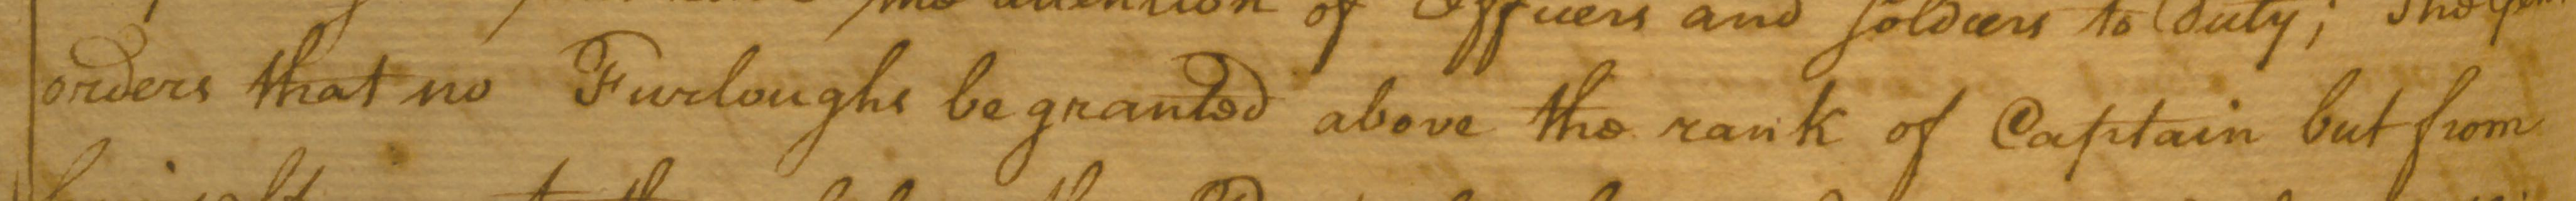orders that no Furloughs be granted above the rank of Captain but from
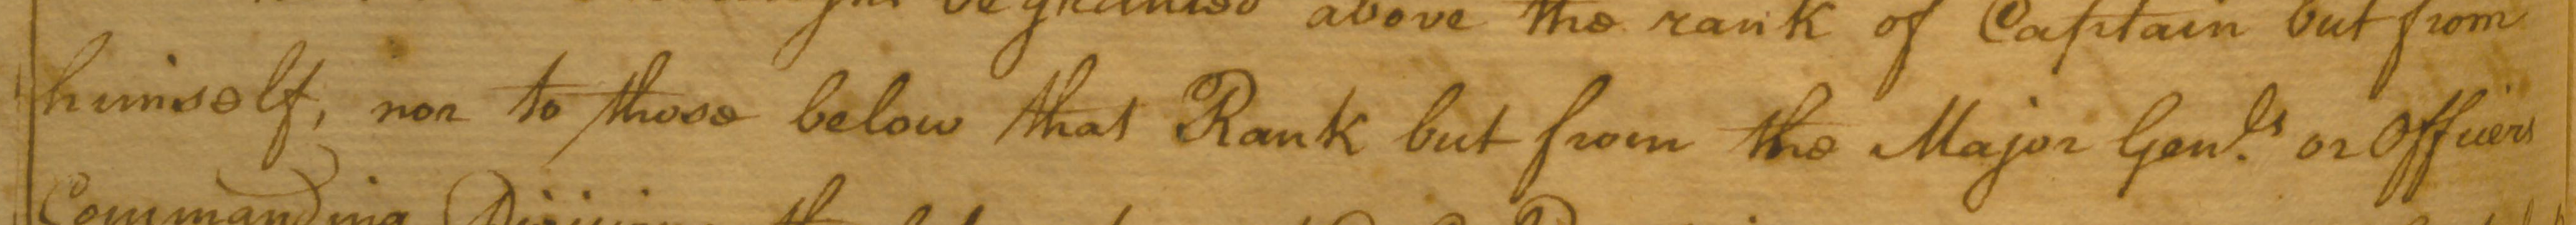himself, nor to those below that Rank but from the Major Gen^ls. or Officers
